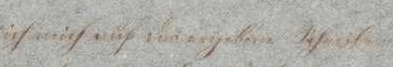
Indem ich mich auf das ergebene Schreiben
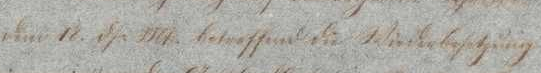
dem 18. dss Mt. betreffend die Wiederbesetzung
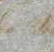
eines
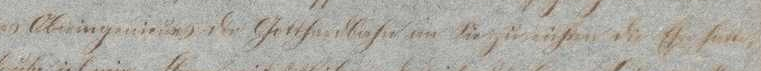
Oberingenieurs der Gotthardbahn an Sie zu richten die Ehre hatte,
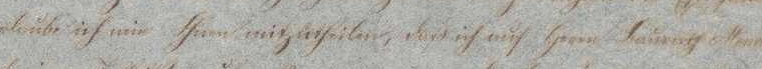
erlaube ich mir Ihnen mitzutheilen, daß ich auf Herrn Baurath Menne
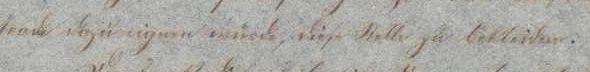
Grade dazu eignen würde, diese Stelle zu bekleiden.
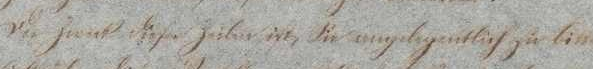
Der Zweck dieser Zeilen ist, Sie angelegentlich zu bitten,
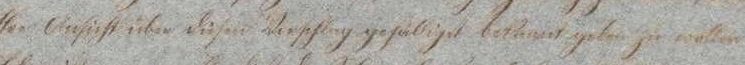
Ihre Ansicht über diesen Vorschlag gefälligst bekannt geben zu wollen.
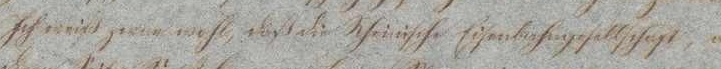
Ich weiß zwar wohl, daß die Rheinische Eisenbahngesellschaft, an
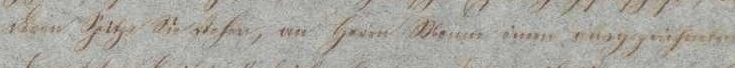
deren Spitze Sie stehen, an Herrn Menne einen ausgezeichneten
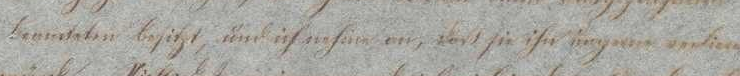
Beamteten besitzt, und ich nehme an, daß sie ihn ungerne verlieren
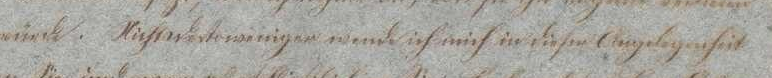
würde. Nichtsdestoweniger wende ich mich in dieser Angelegenheit
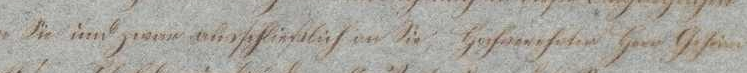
an Sie und zwar ausschließlich an Sie, Hochverehrter Herr Geheim-
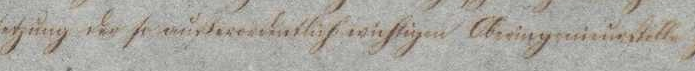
setzung der so außerordentlich wichtigen Oberingenieurstelle
